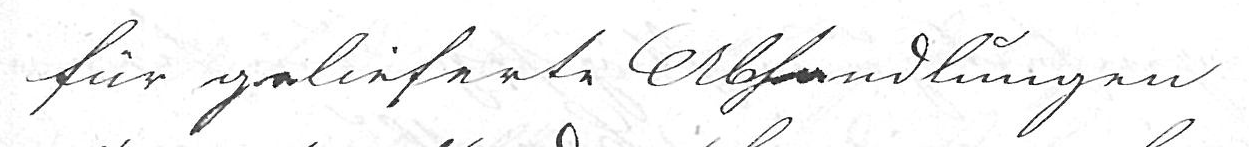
für gelieferte Abhandlungen
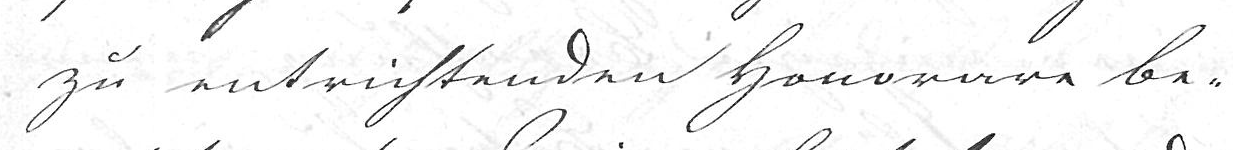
zu entrichtenden Honorare be-
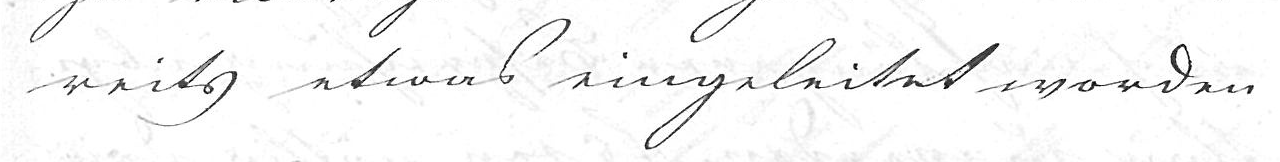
reits etwas eingeleitet worden
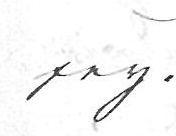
sey.
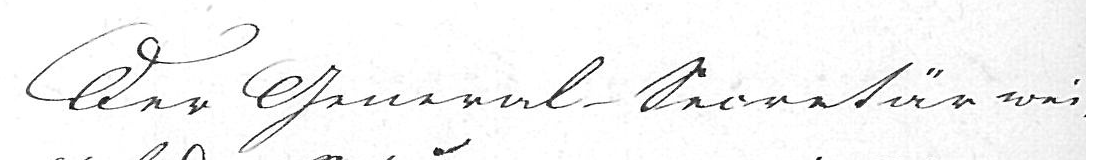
Der General-Secretär wei-
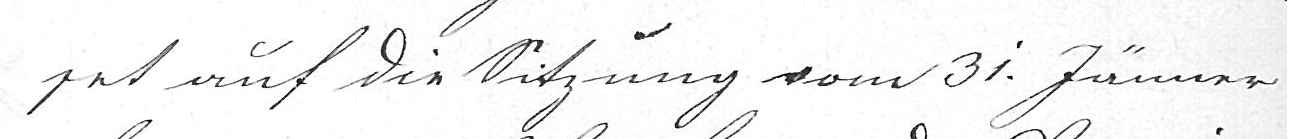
set auf die Sitzung vom 31. Jänner
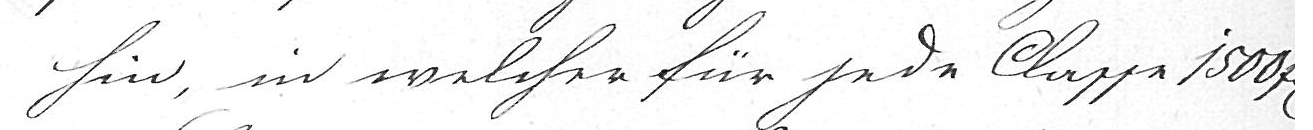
hin, in welcher für jede Classe 1500 fl
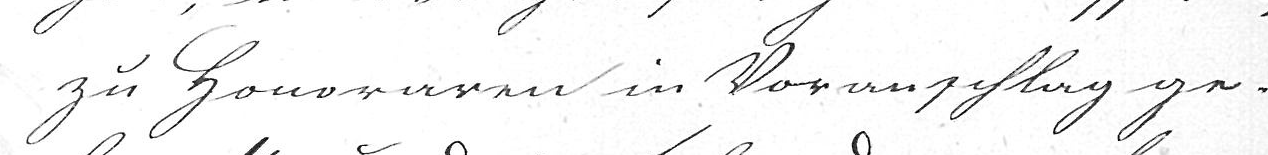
zu Honoraren in Voranschlag ge-
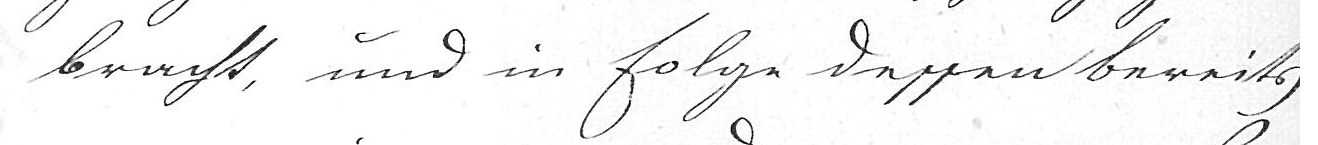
bracht, und in Folge dessen bereits
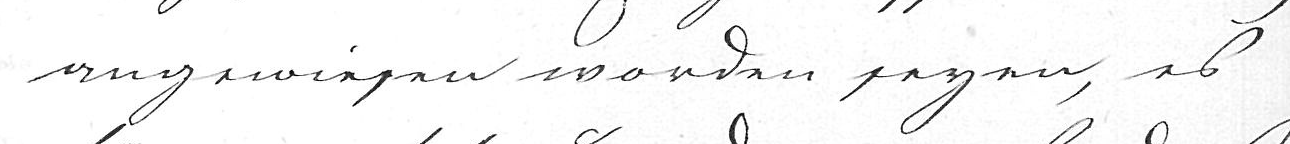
angewiesen worden seyen, es
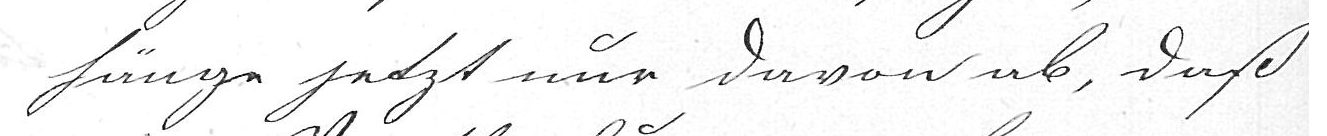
hänge jetzt nur davon ab, daß
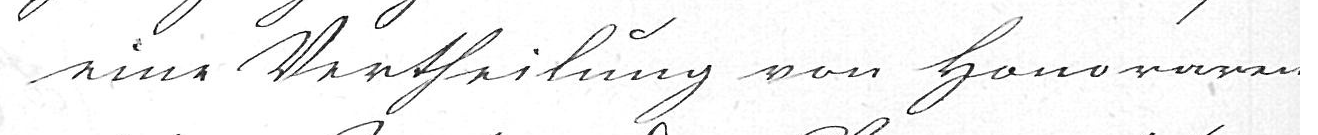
eine Vertheilung von Honoraren
